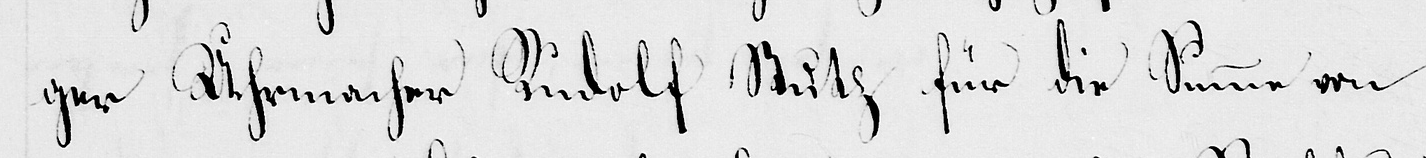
ger Uhrmacher Rudolf Stutz für die Summe von
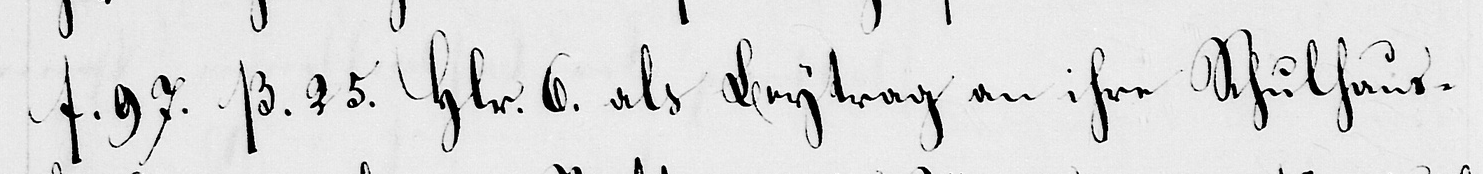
f. 97. ß. 25. hlr. 6. als Beytrag an ihre Schulhaus¬
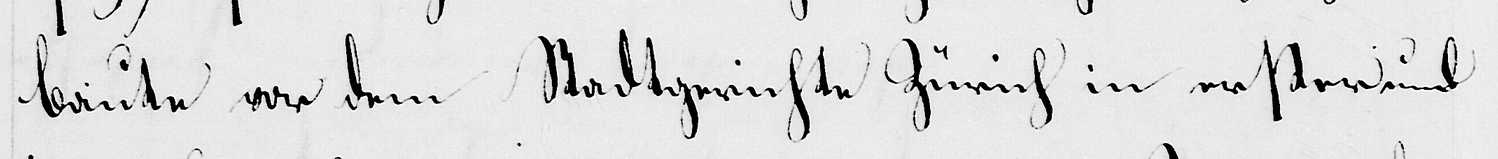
baute vor dem Stadtgerichte Zürich in erster und
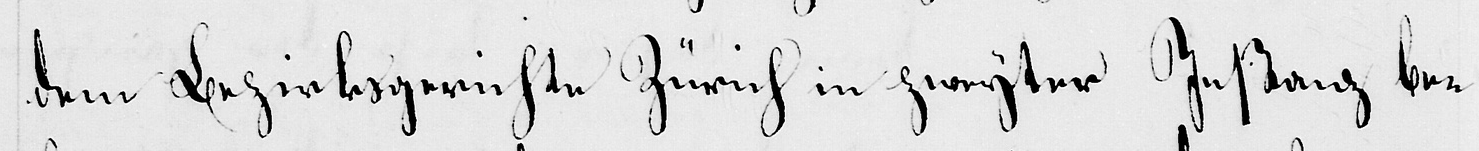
dem Bezirksgerichte Zürich in zweyter Instanz be¬
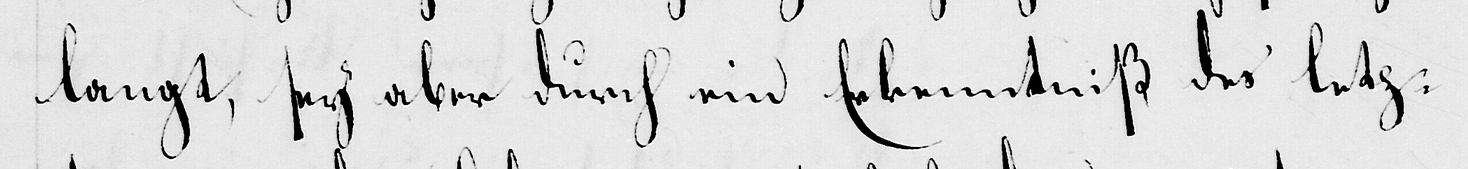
langt, sey aber durch ein Erkenntniß des letz¬
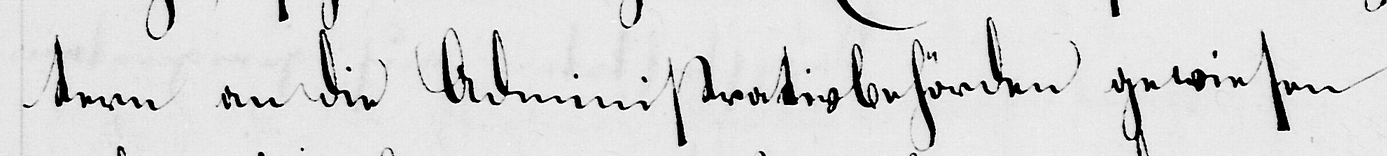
tern an die Administrationsbehörden gewiesen
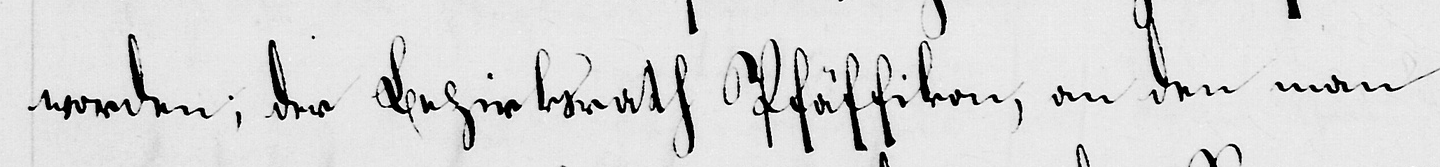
worden; der Bezirksrath Pfäffikon, an den man
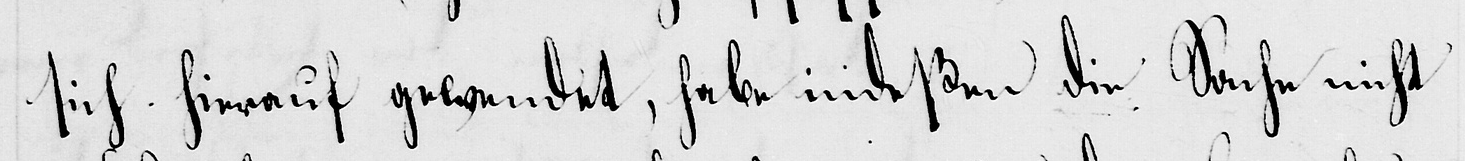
sich hierauf gewendet, habe indeßen die Sache nicht
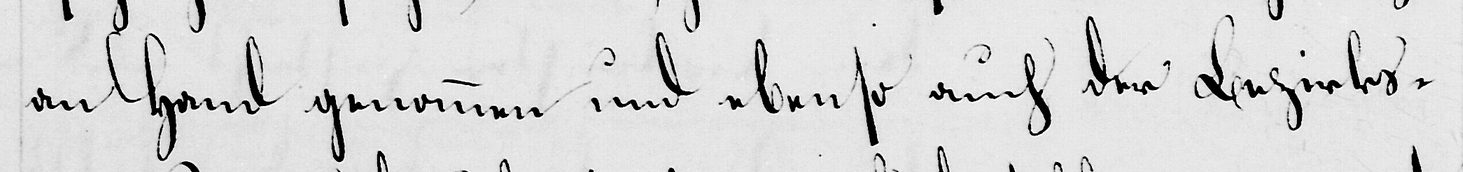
an Hand genommen und ebenso auch der Bezirks¬
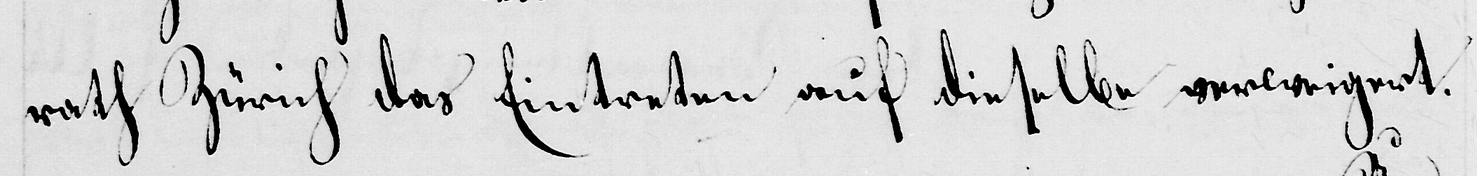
rath Zürich das Eintreten auf dieselbe verweigert.
